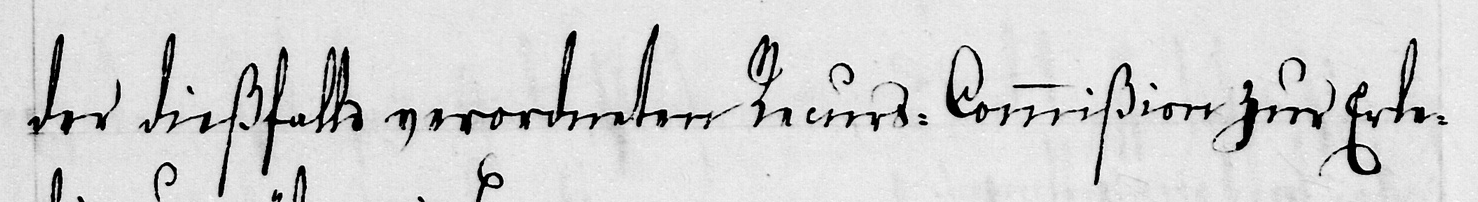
der dießfalls verordneten Recurs-Commißion zur Erle¬
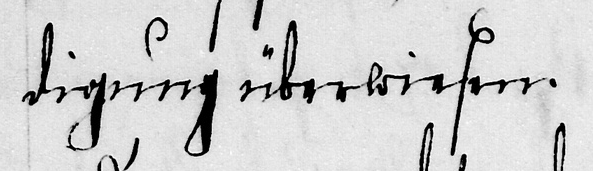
digung überwiesen.
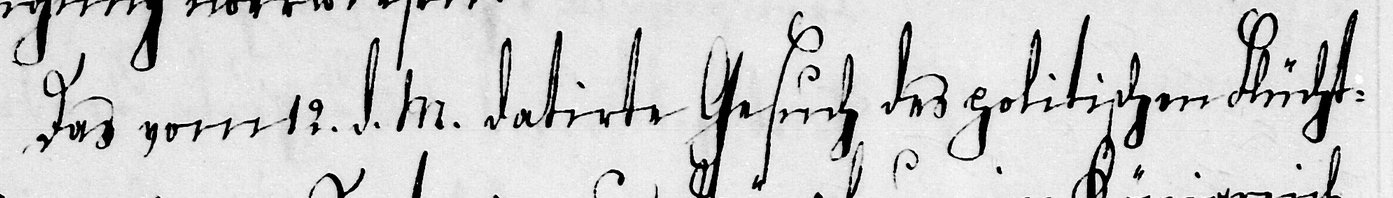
Das vom 12. d. M. datirte Gesuch des politischen Flüch¬
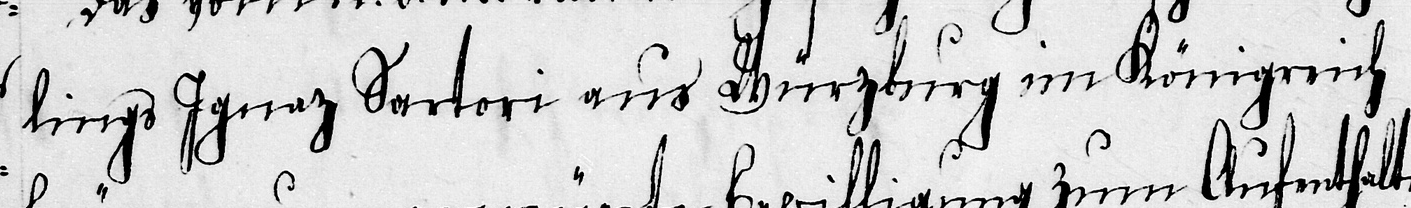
tlings Ignaz [sic!] Sartori aus Würzburg im Königreich
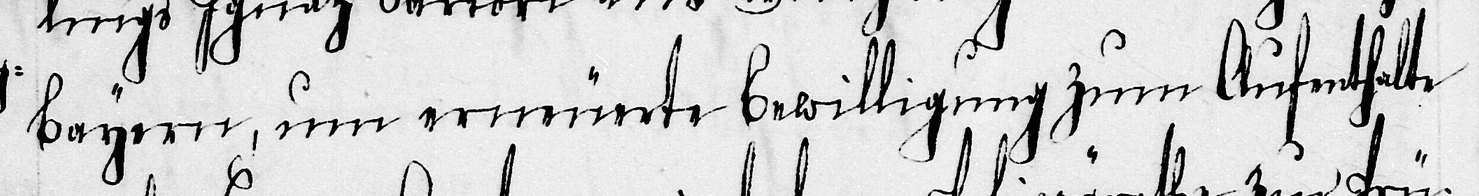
Bayern, um erneuerte Bewilligung zum Aufenthalte
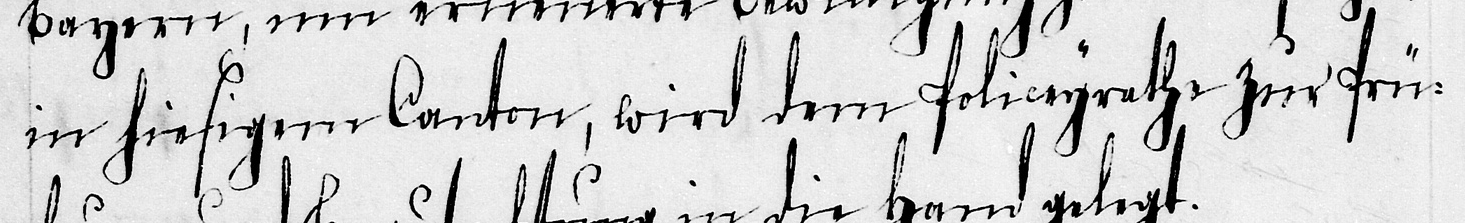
in hiesigem Canton, wird dem Policeyrathe zur Prü¬
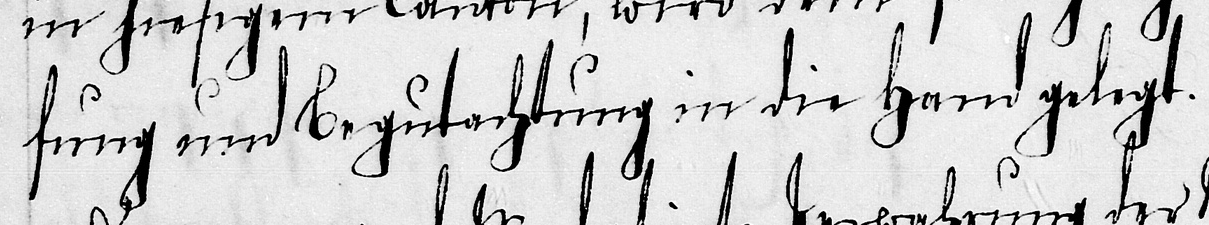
fung und Begutachtung in die Hand gelegt.
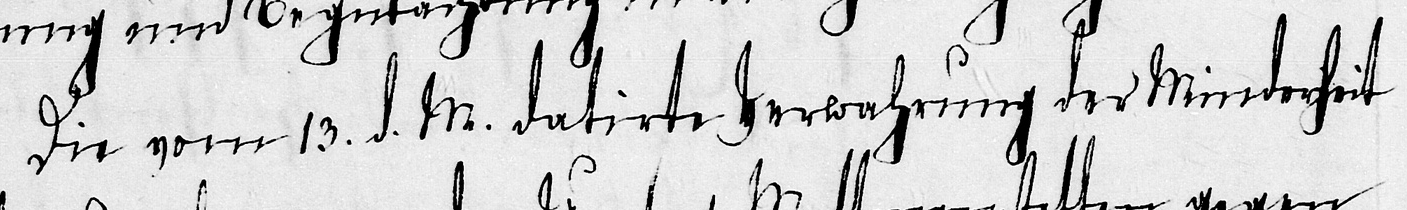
Die vom 13. d. M. datirte Verwahrung der Minderheit
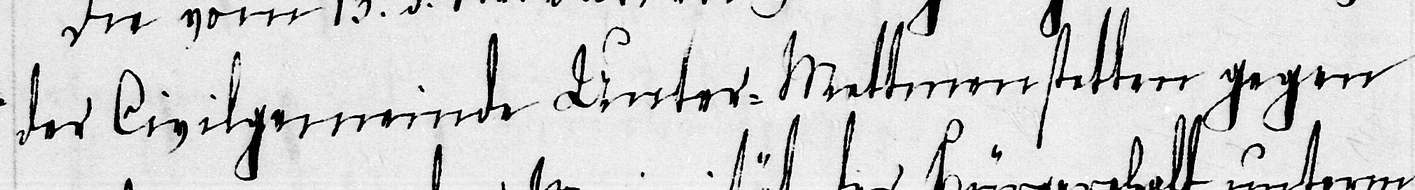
der Civilgemeinde Unter-Mettmenstetten gegen
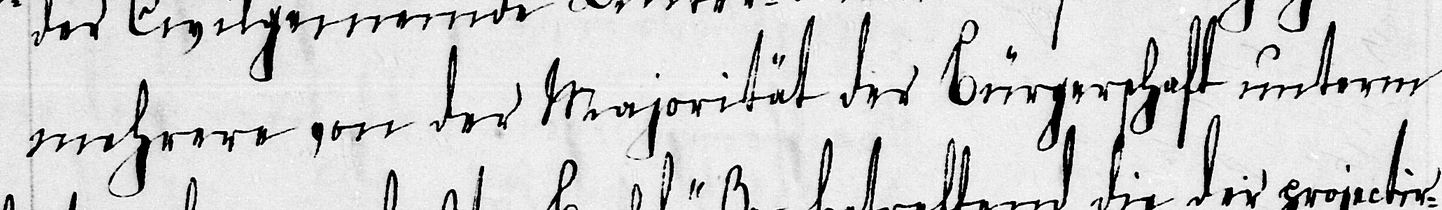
mehrere von der Majorität der Bürgerschaft unterm
